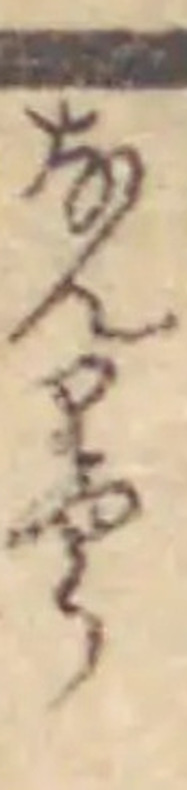なんりやう
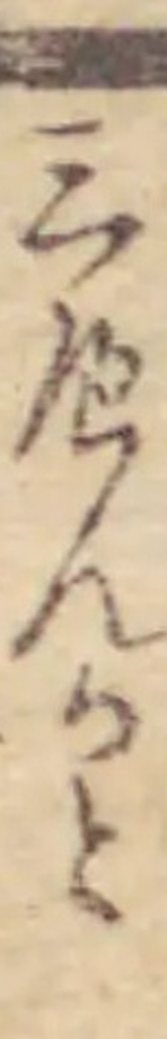三へんかと
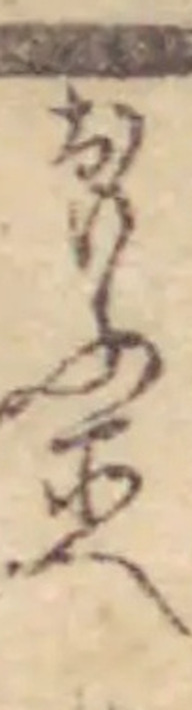おもふ所へ
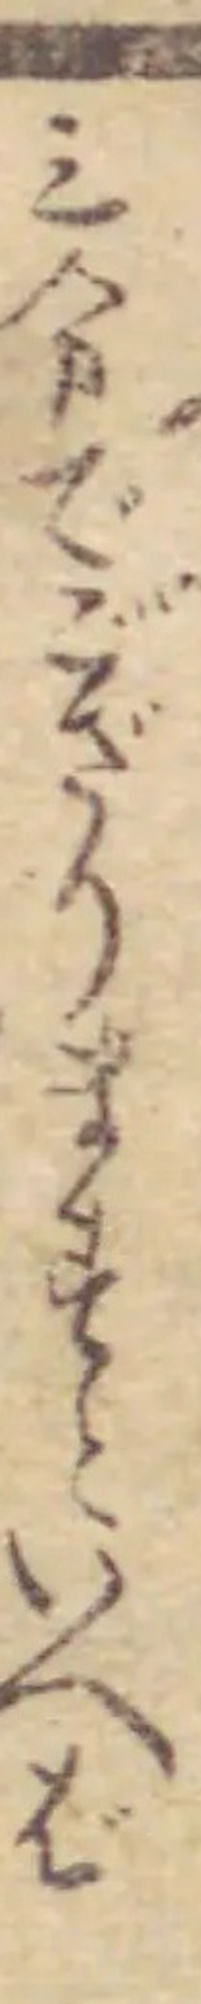三分でござりますといへば
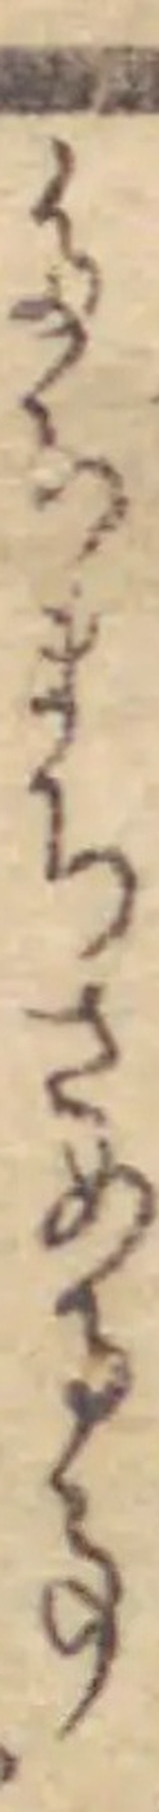たちまちさめる事
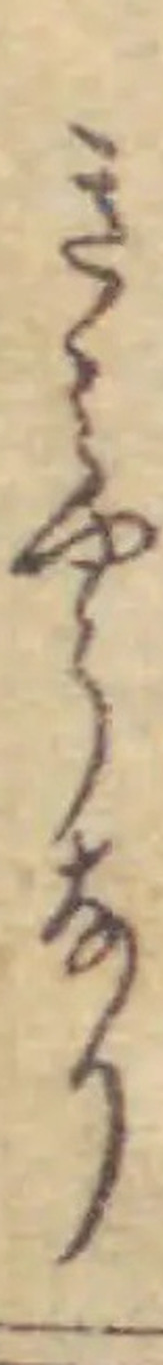きみやうなり

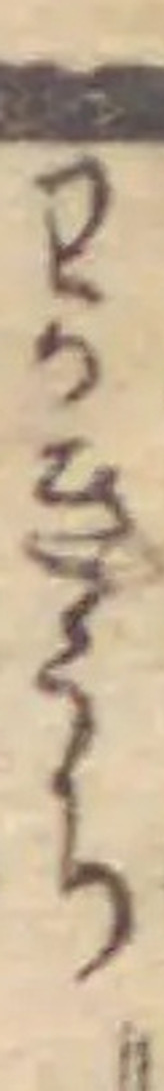わかきうち
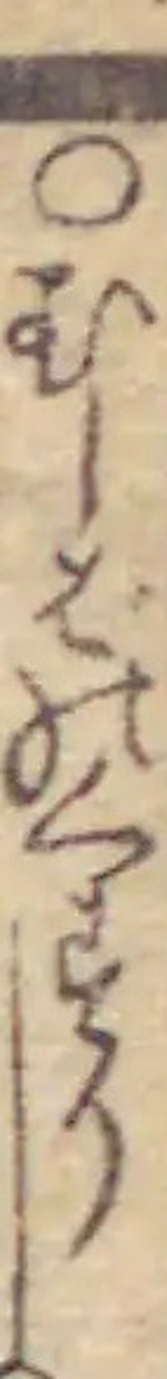○むしばのくすり
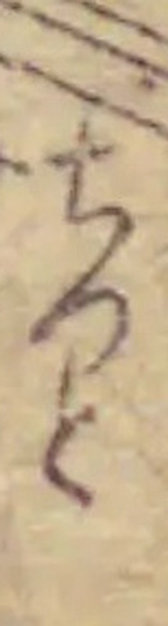ちつと
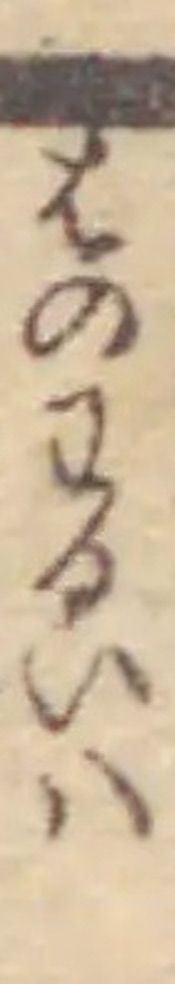はのわるいは
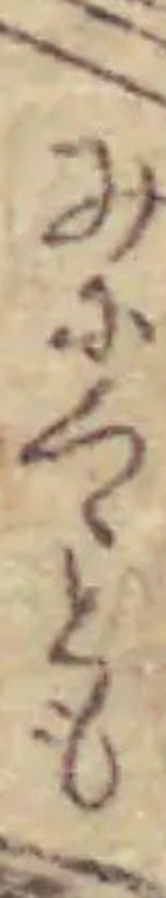みにくゝとも
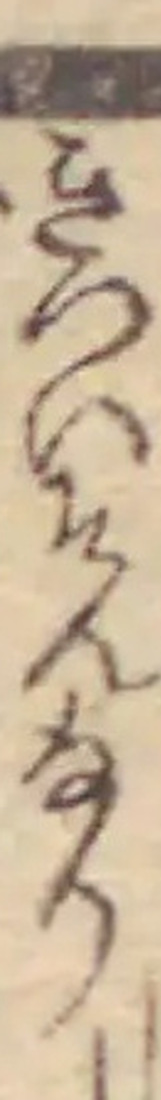きついそんなり
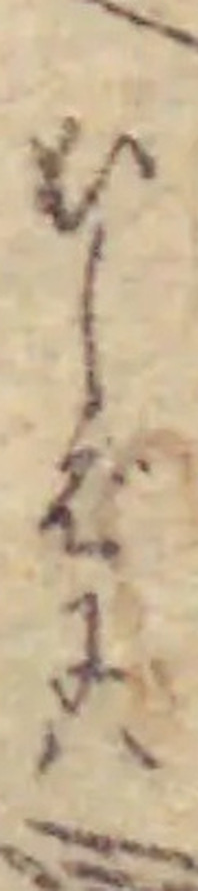むしばには
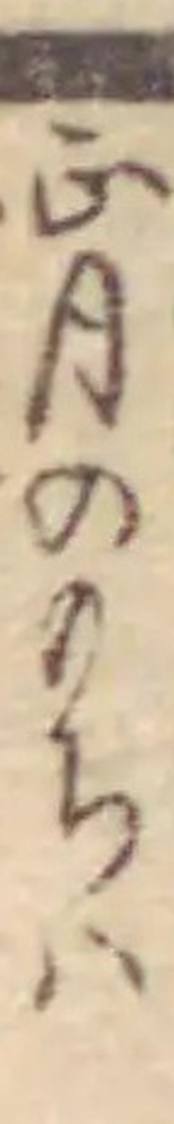正月のもちは
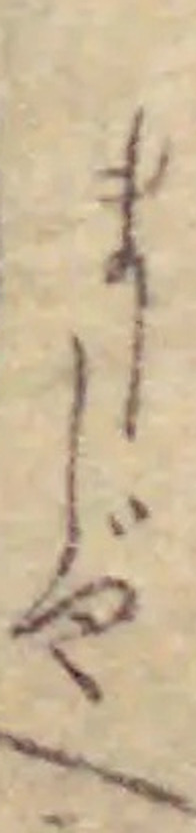ましじや
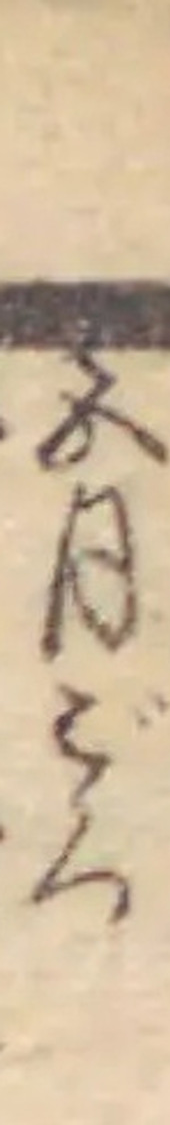五月ごろ
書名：家伝寿命薬 2巻
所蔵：国立国会図書館 National Diet Library, JAPAN
